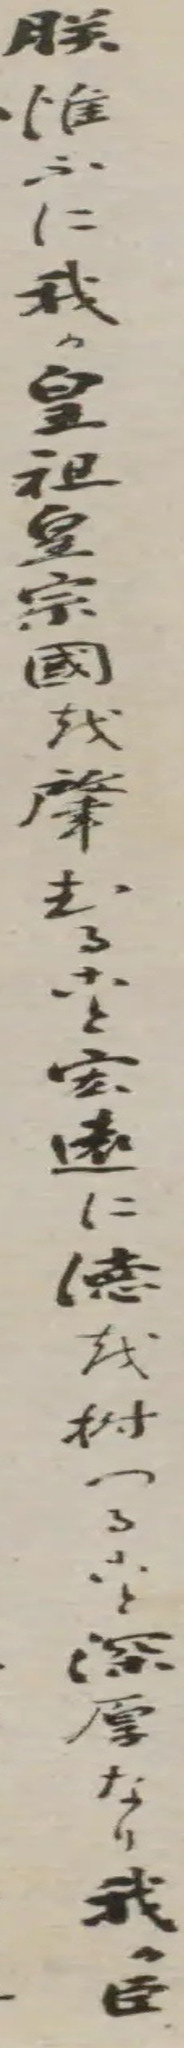朕惟ふに我か皇祖皇宗国を肇むること宏遠に徳を樹つること深厚なり我か臣
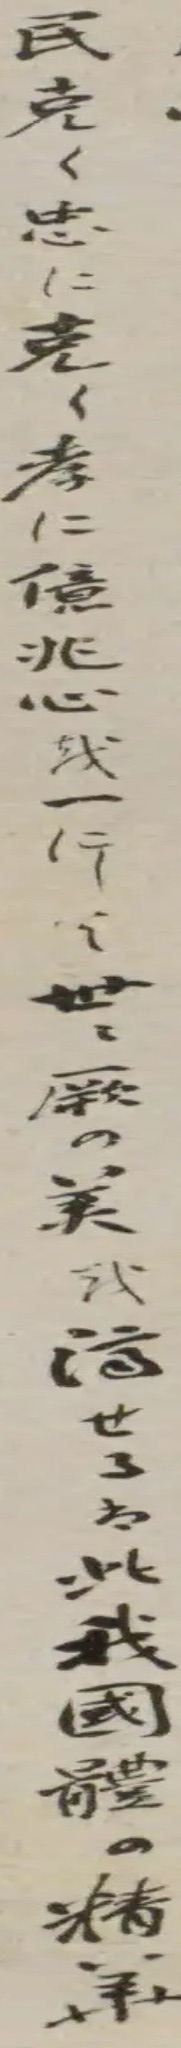民克く忠に克く孝に億兆心を一にして世々厥の美を済せるは此我国体の精華
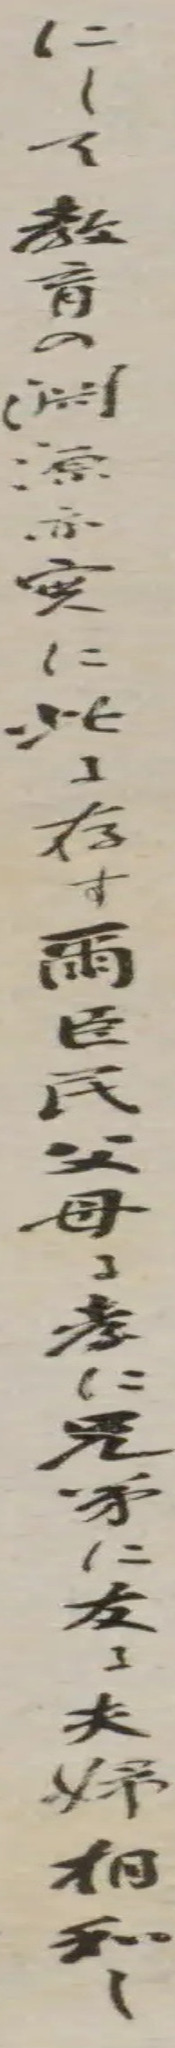にして敎育の淵源亦実に此に存す爾臣民父母に孝に兄弟に友に夫婦相和し
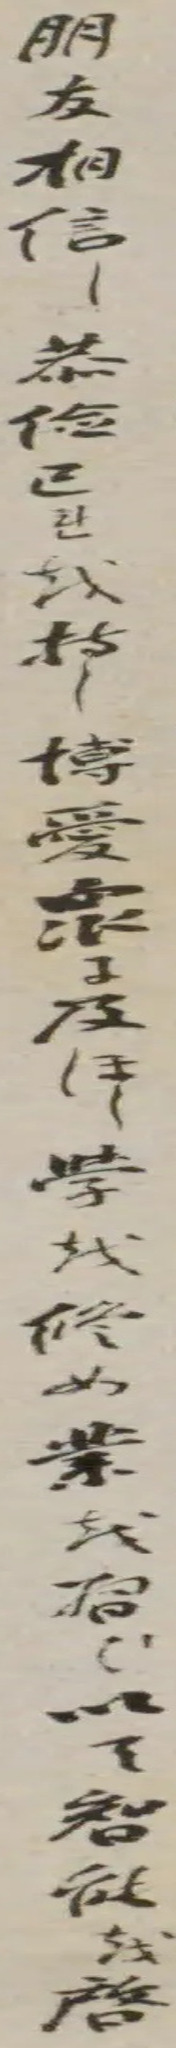朋友相信し恭倹己れを持し博愛衆に及ほし学を修め業を習ひ以持て智能を啓
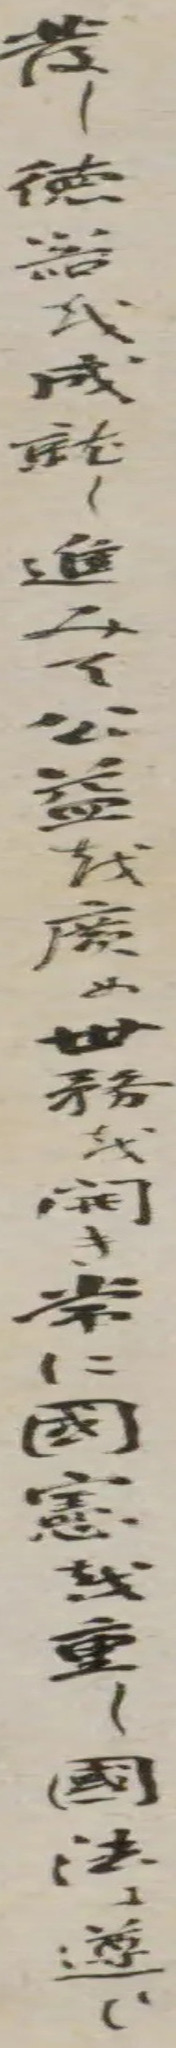発し德器を成就し進みて公益を広め世務を開き常に国憲を重し国法に遵ひ
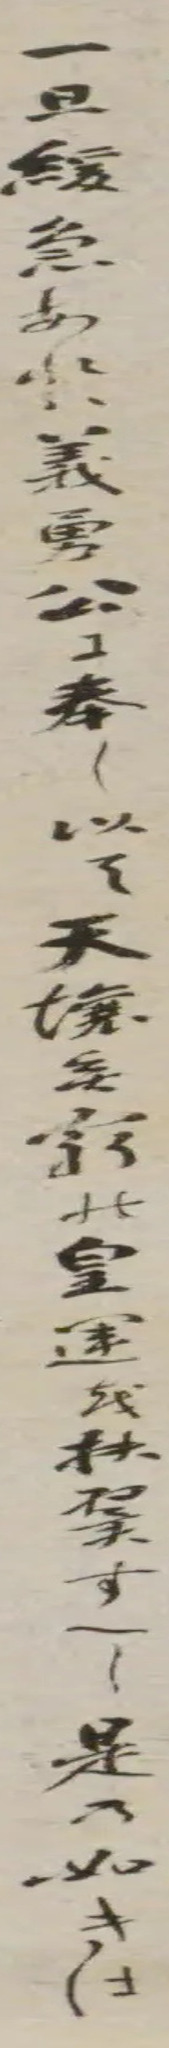一旦緩急あれは義勇公に奉し以て天壌無窮の皇運を扶翼すへし是の如きは
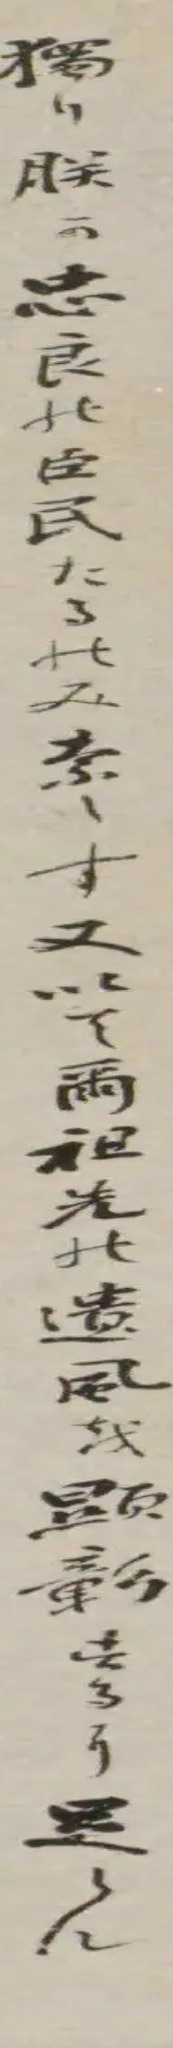独り朕か忠良の臣民たるのみならす又以て爾祖先の遺風を顕彰するに足らん
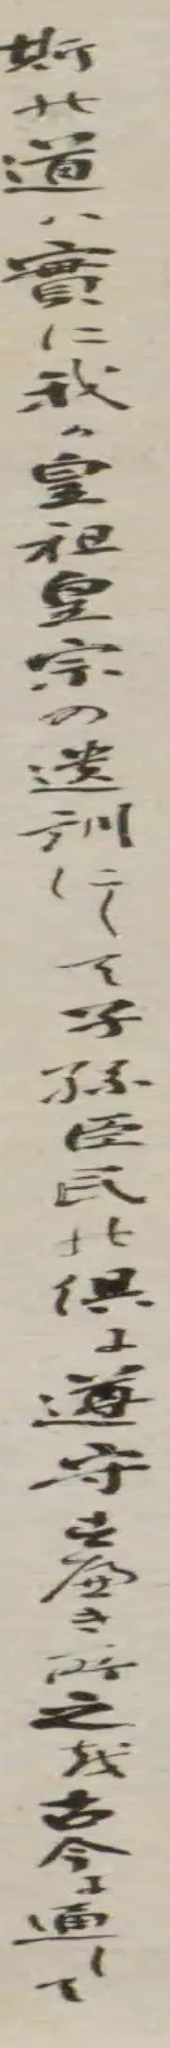斯の道は実に我か皇祖皇宗の遺訓にして子孫臣民の倶に遵守すへき所之を古今に通して
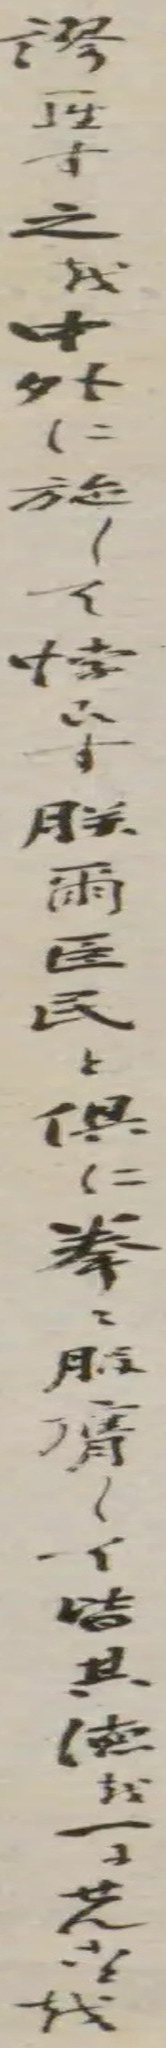謬らす之を中外に施して悖らす朕爾臣民と倶に拳々服膺して皆其徳を一にせんことを
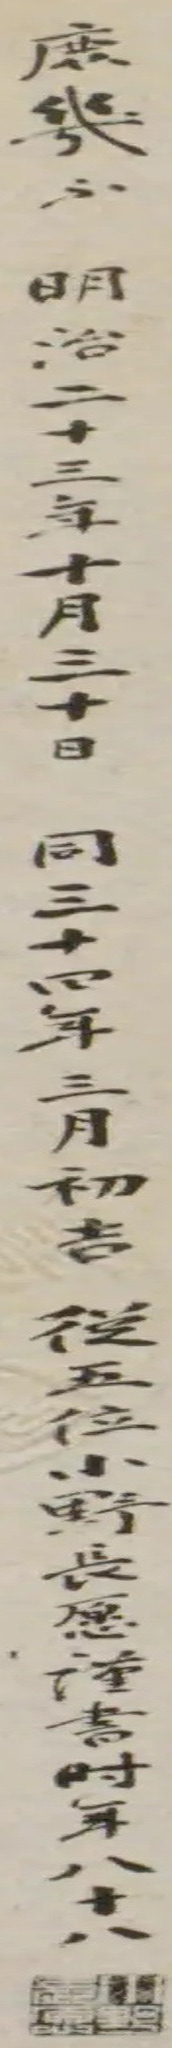庶幾ふ明治二十三年十月三十日同三十四年三月初吉従五位小野長愿謹書時年八十八
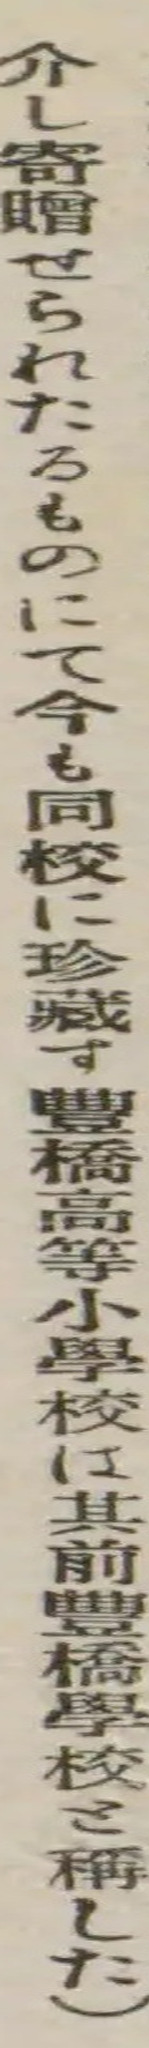介し寄贈せられたるものにて今も同校に珍蔵す豊橋高等小学校は其前豊橋学校と称した)

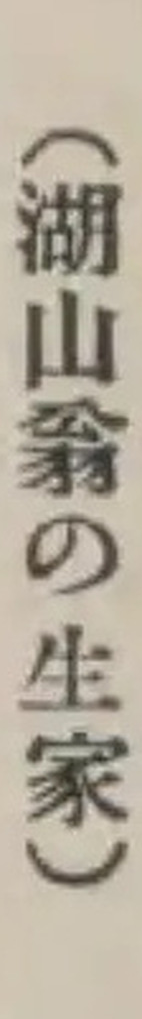(湖山翁の生家)
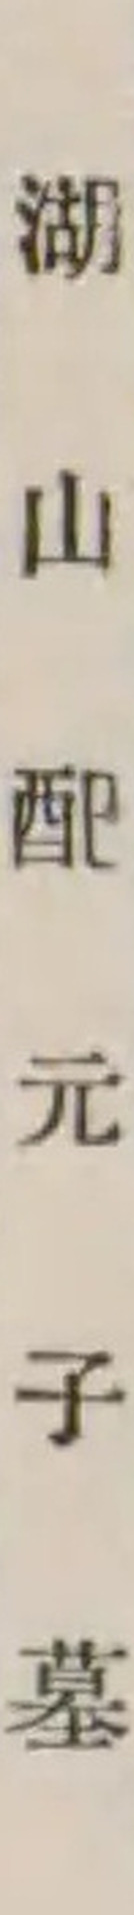湖山配元子墓

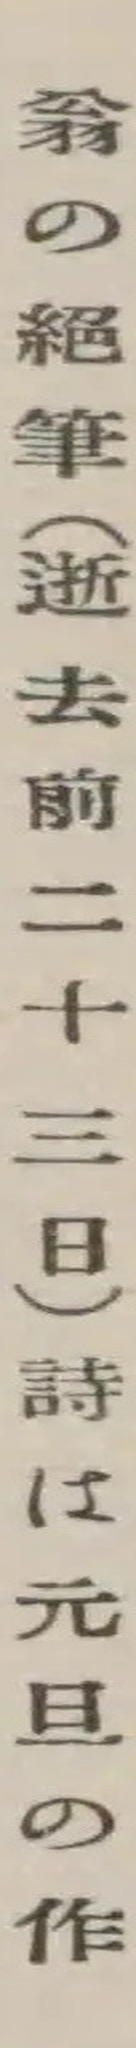翁の絶筆(逝去前二十三日)詩は元旦の作
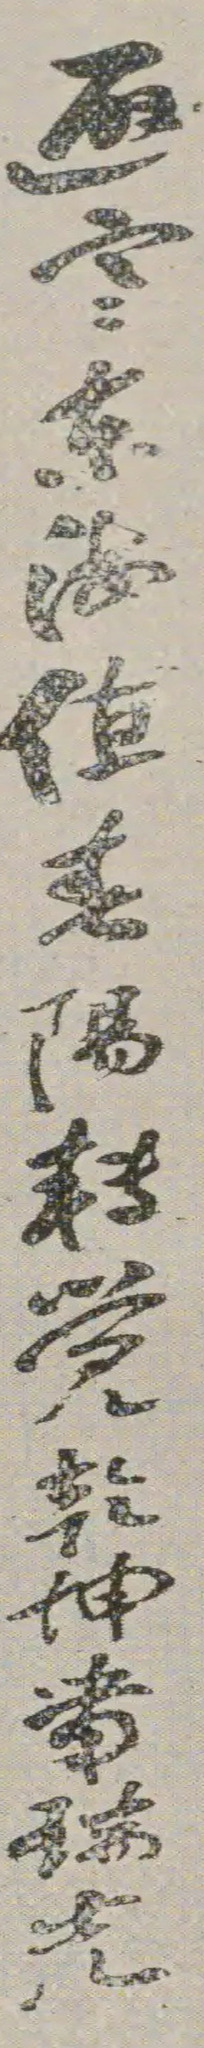避寒東海値春陽轉覚乾坤帯瑞光
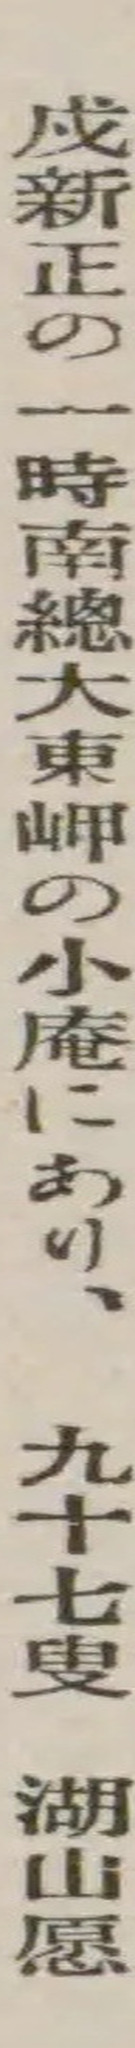戌新正の一時南総大東岬の小庵にあり、九十七叟湖山愿
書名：小野湖山翁小伝
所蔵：国立国会図書館 National Diet Library, JAPAN
